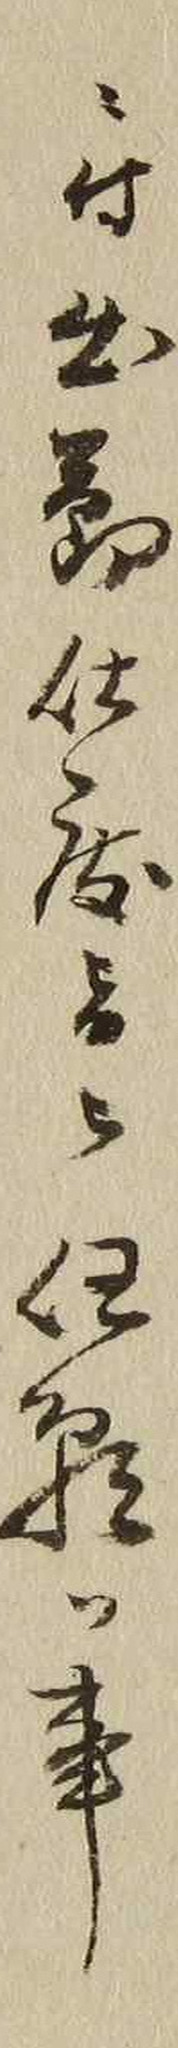ニ付出勤仕度旨被任願候事
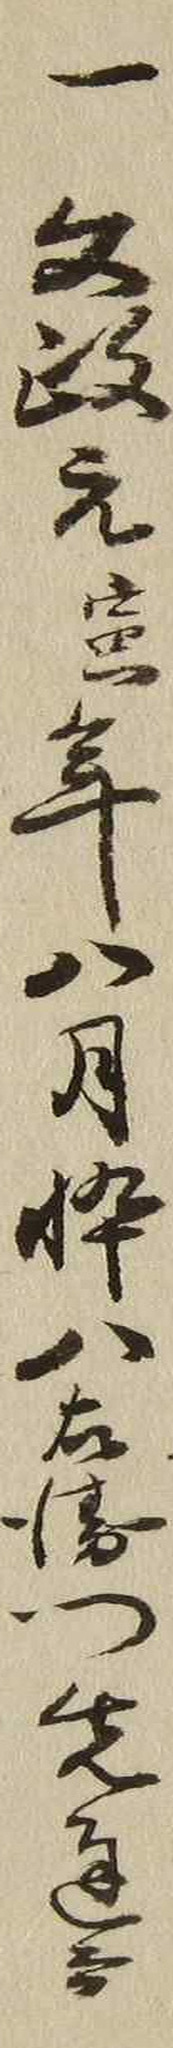一文政元寅年八月忰八右衛門先達而
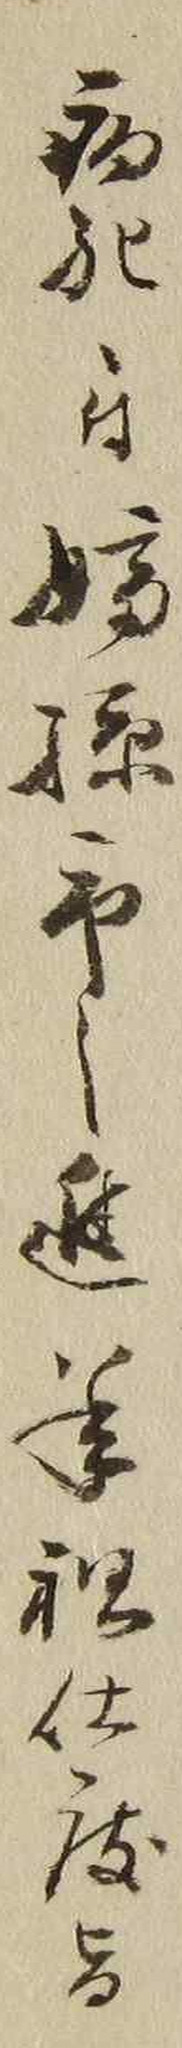病死ニ付嫡孫市之進承祖仕度旨
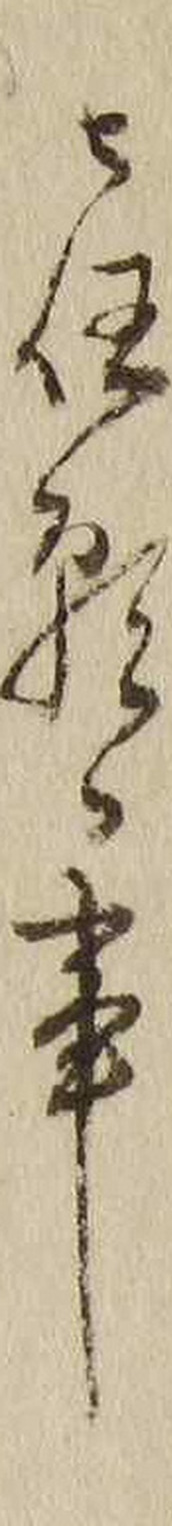被任願候事
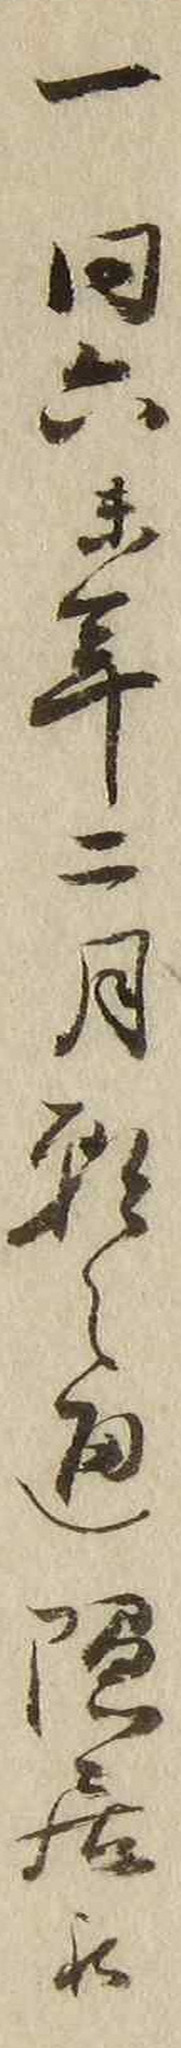一同六未年二月願之通隠居被
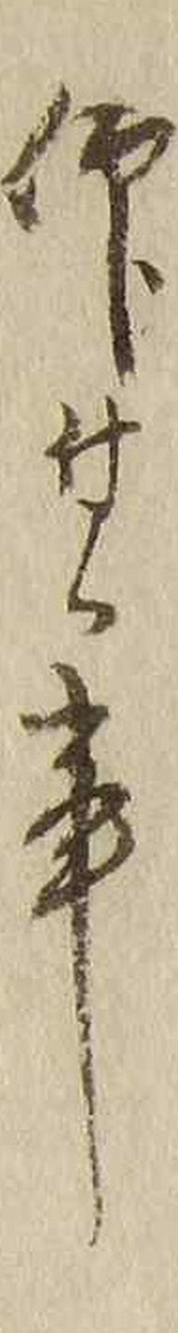仰付候事

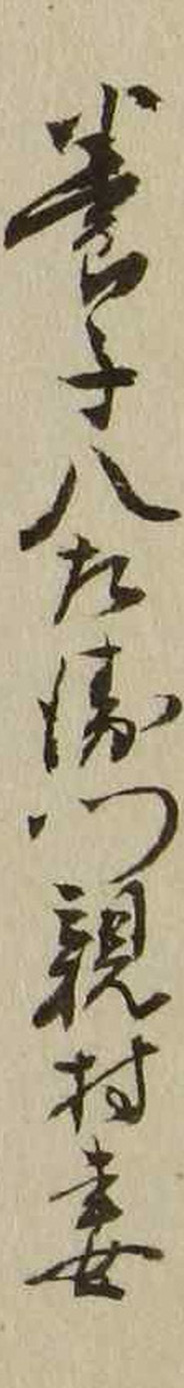女養子八左衛門親村妻
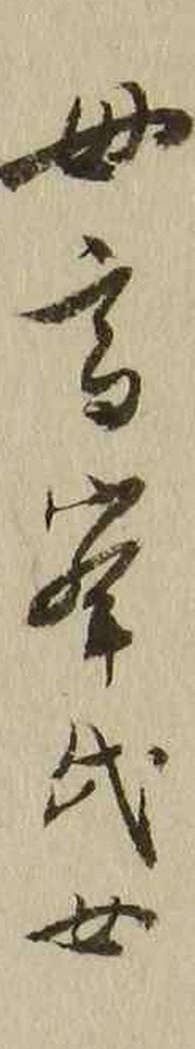母高峰氏女
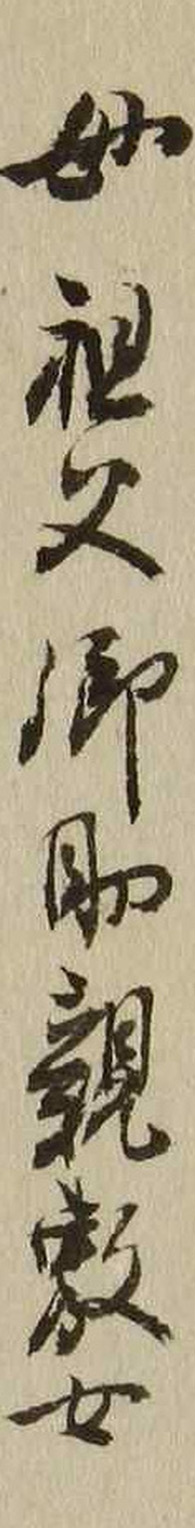母祖父郷助親敷女
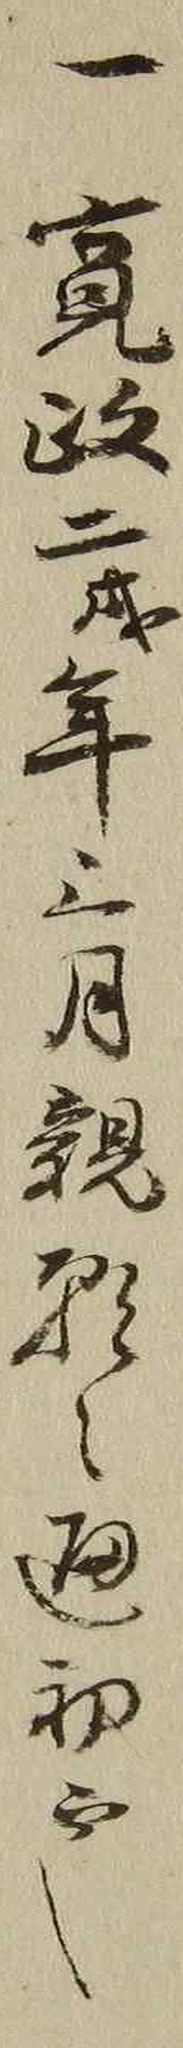一寛政二戌年三月親願之通初而之
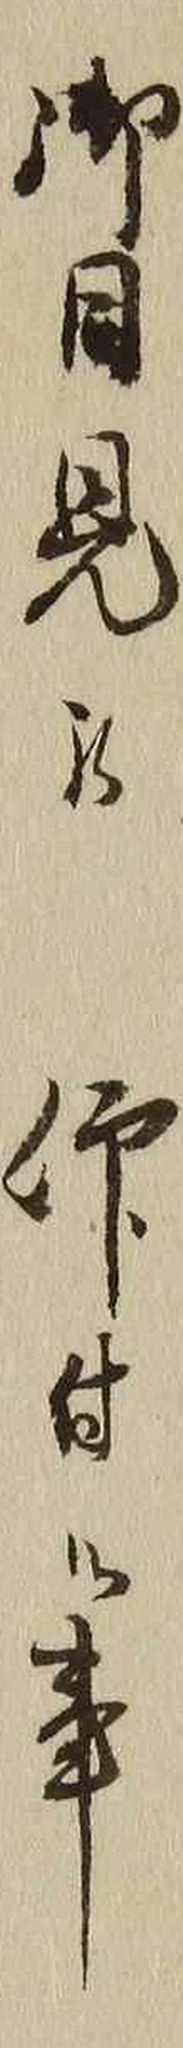御目見被仰付候事
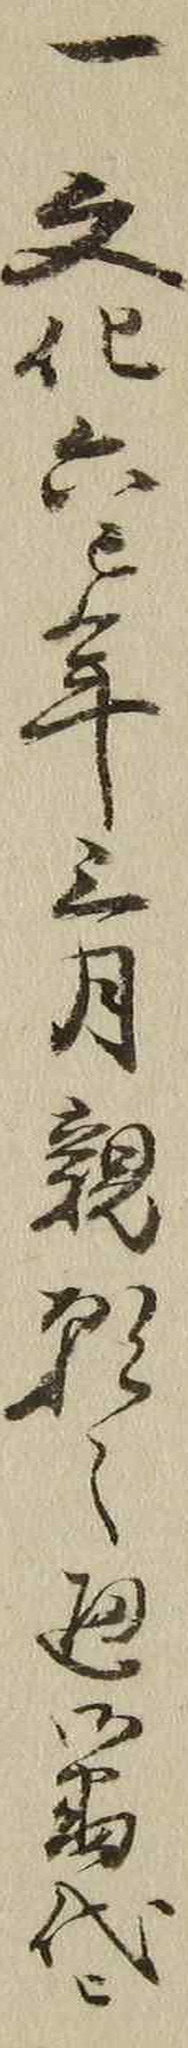一文化六巳年三月親願之通御番代被
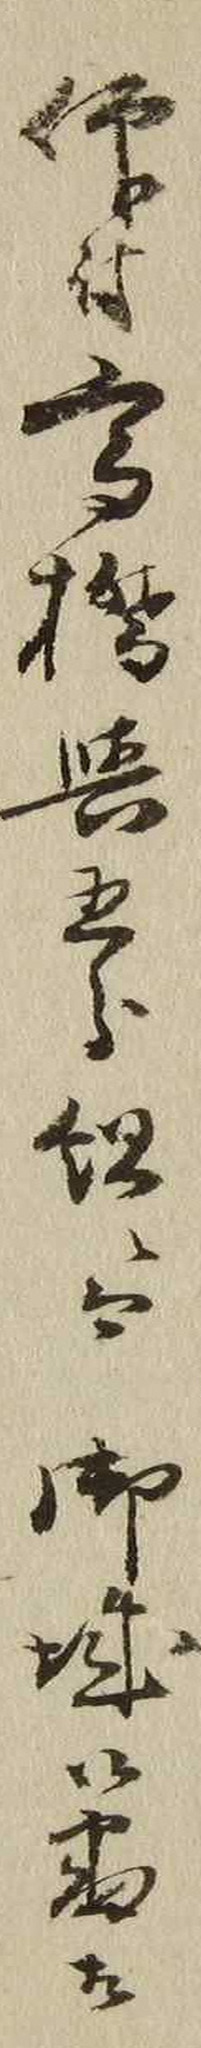仰付高橋与五郎組ニ而御城御番相
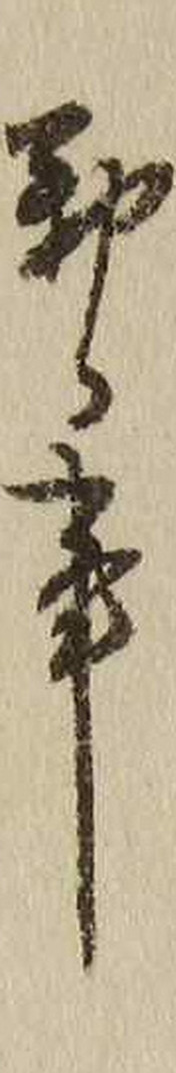勤候事
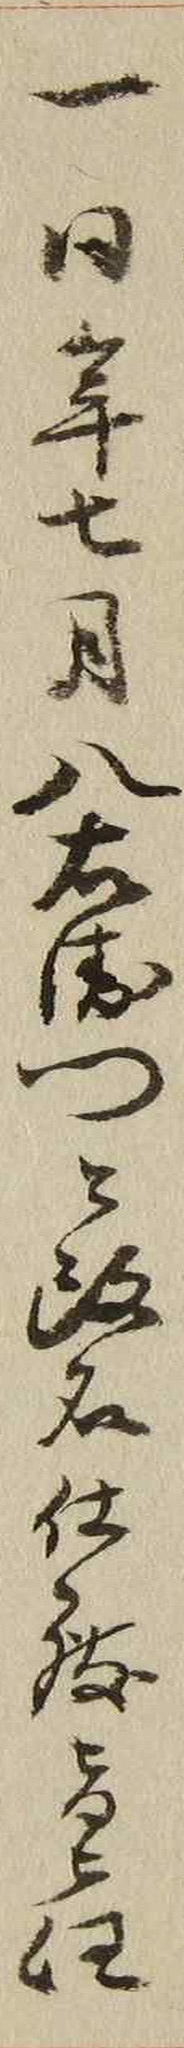一同年七月八右衛門と改名仕度旨被任
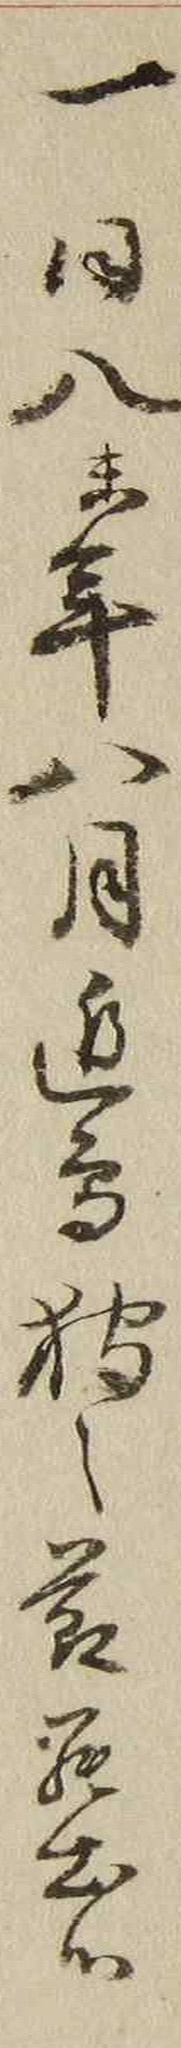一同八未年八月追鳥狩之節罷出候
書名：諸士系譜　巻之232　け之部1
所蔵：会津若松市立会津図書館
